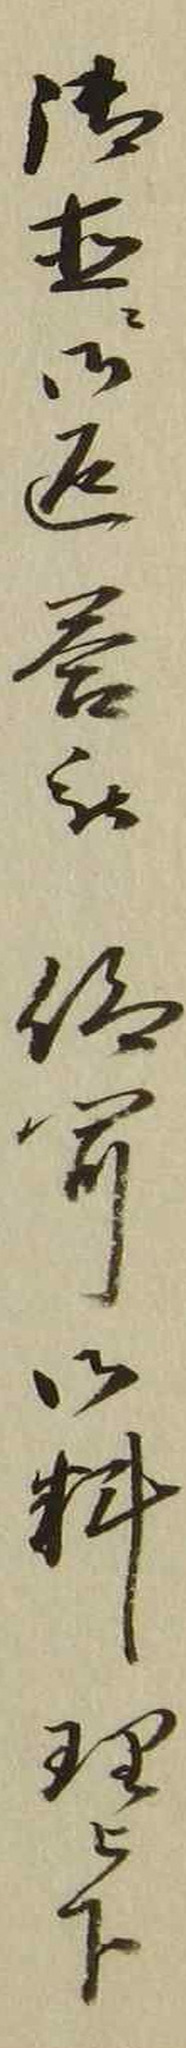御直ニ御返答被仰聞御料理被下
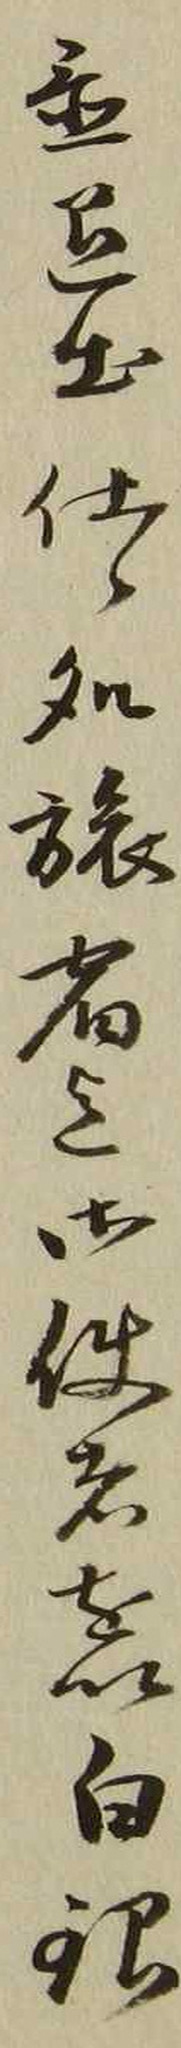置退出仕候処旅宿迄御使者を以白銀
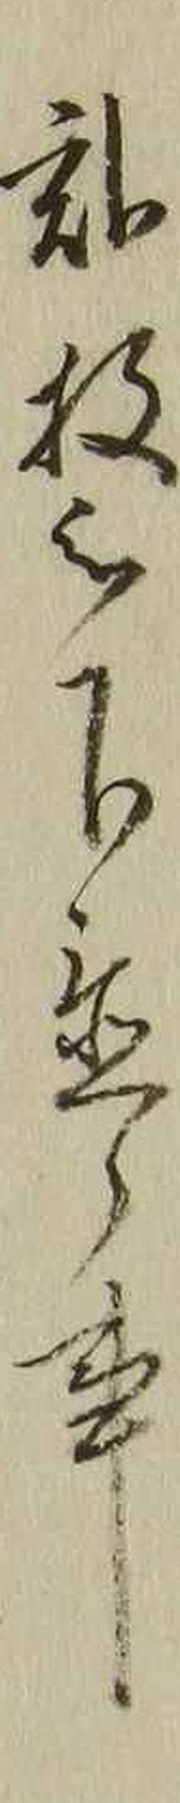弐枚被下置候事
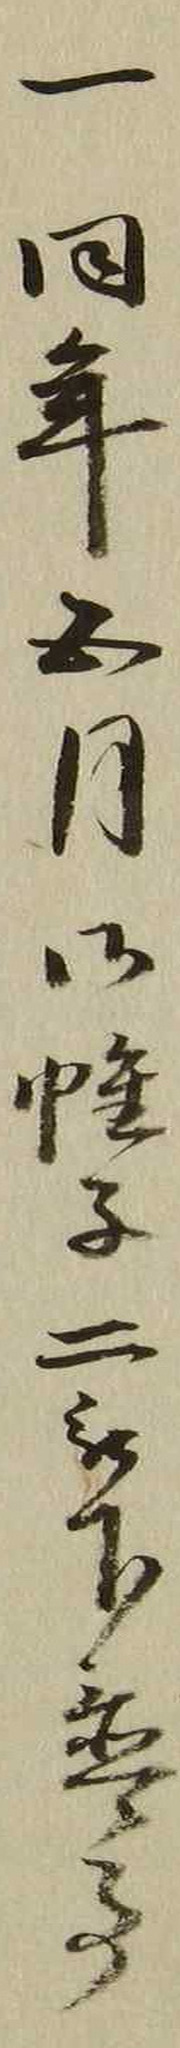一同年五月御帷子二被下置候事
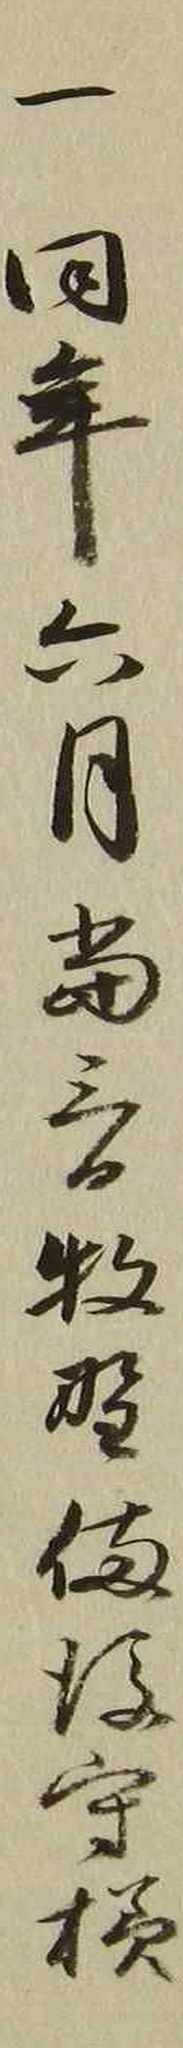一同年六月当三日牧野備後守様
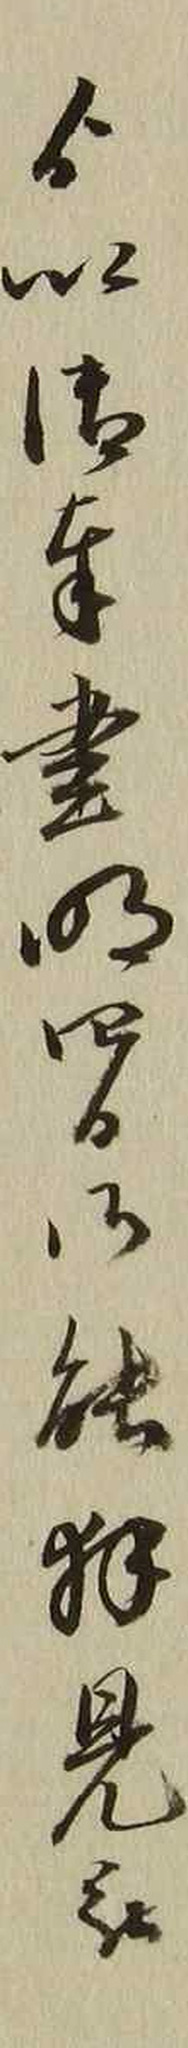ゟ以御奉書明四日御能拝見被
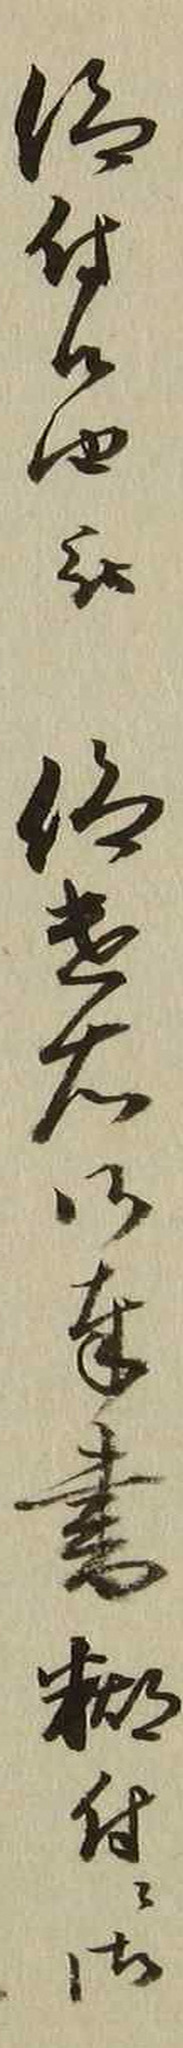仰付候由被仰遣右御奉書糊付ニ御
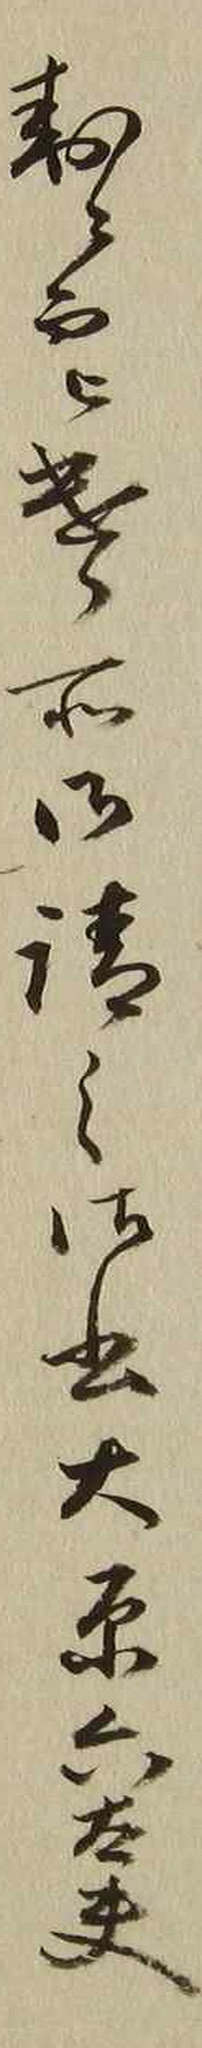封ニ而被遣候所御請之御書大原六太夫
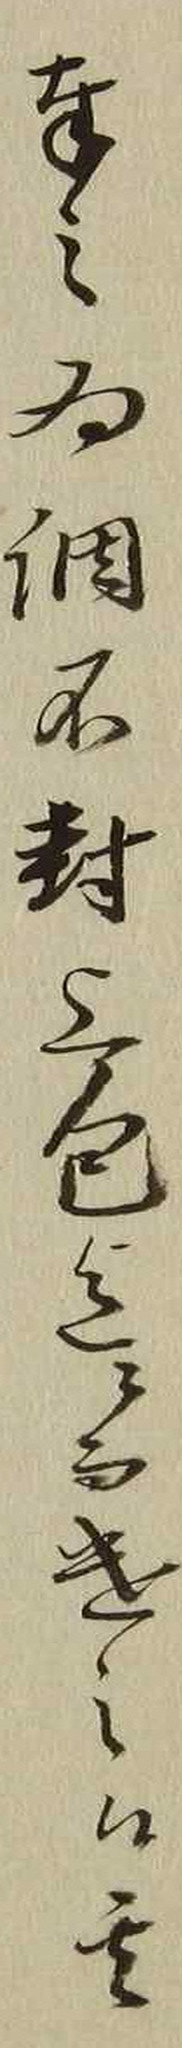奉之為調不封上包迄ニ而遣之候其
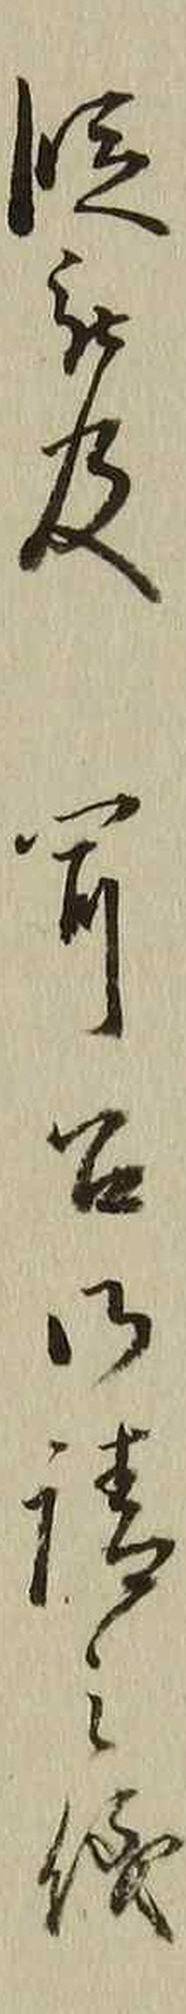段被及聞召御請之儀
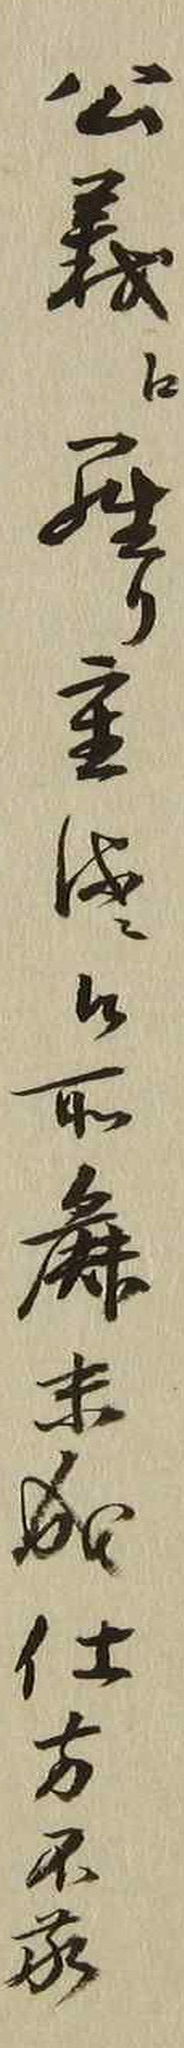公儀江罷り重儀ニ候所麁末成仕方不敬
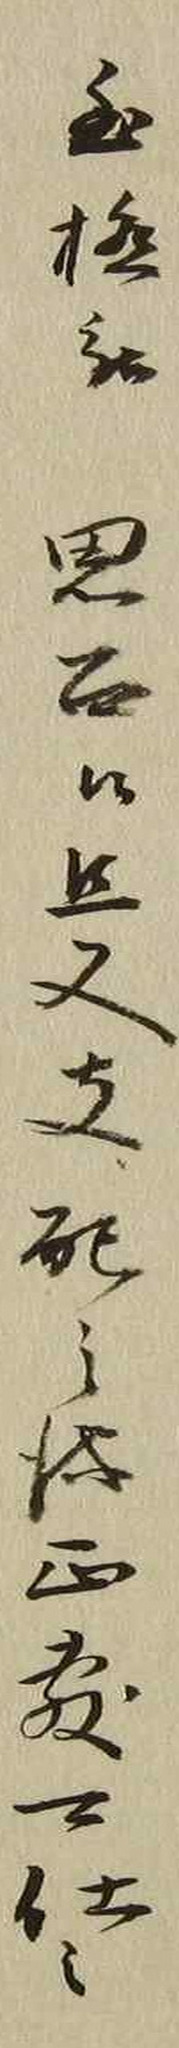至極被思召候且又支配之儀正敷可仕之
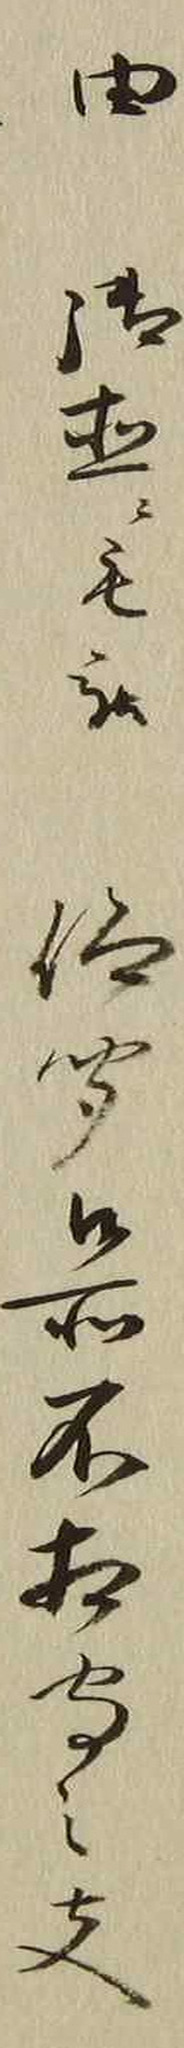由御直ニも被仰聞候所不相守之支
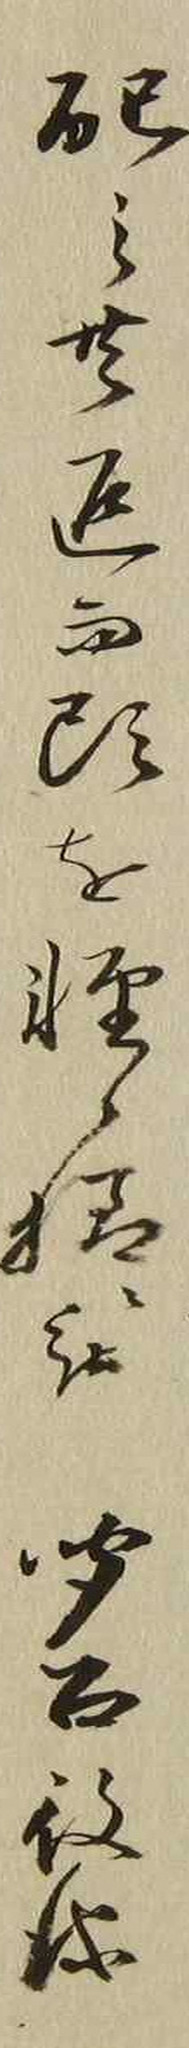配之共返而頭を軽候様ニ被聞召役儀
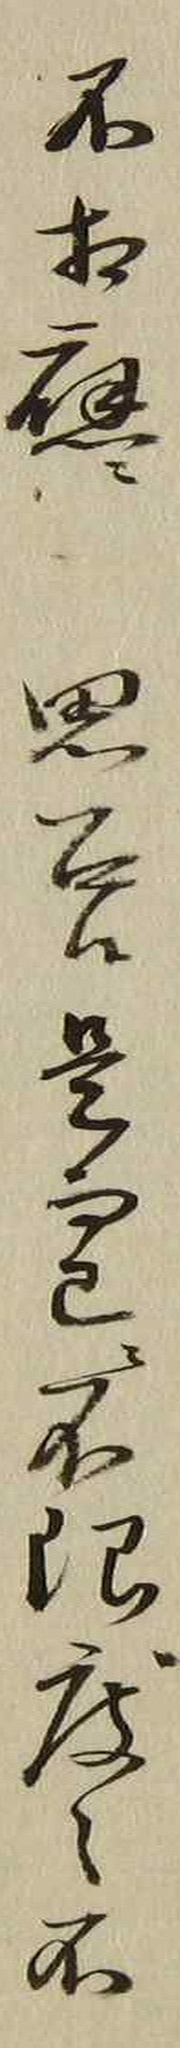不相応ニ思召候是而已ニ不限度々不
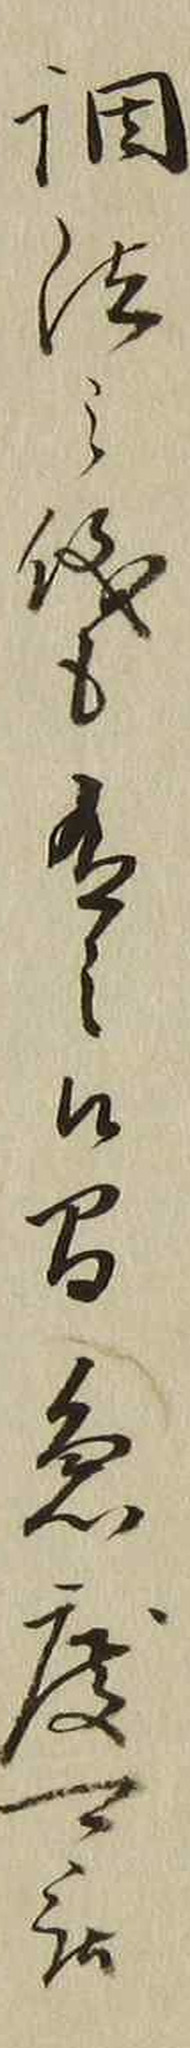調法之儀も有之候間急度可被
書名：諸士系譜　巻之69　を之部3
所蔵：会津若松市立会津図書館
